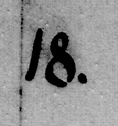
40.
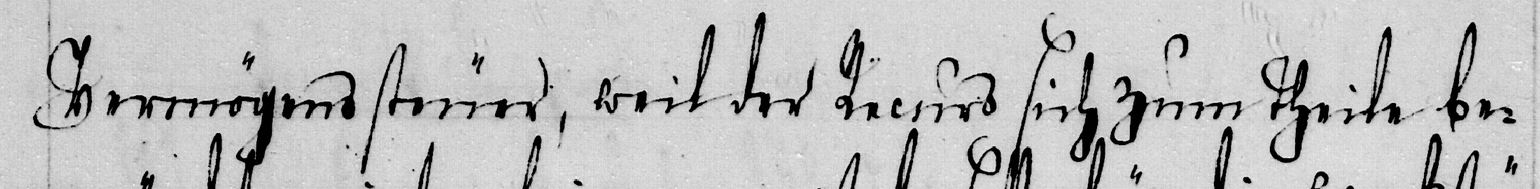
Vermögenssteuer, weil der Recurs sich zum Theile be¬
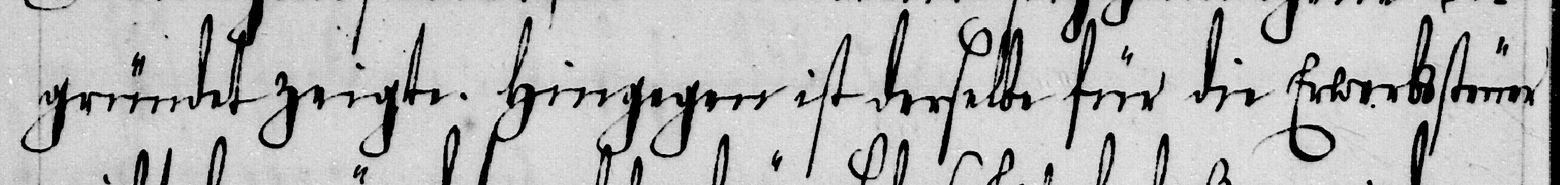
gründet zeigte. Hingegen ist derselbe für die Erwerbsste¬
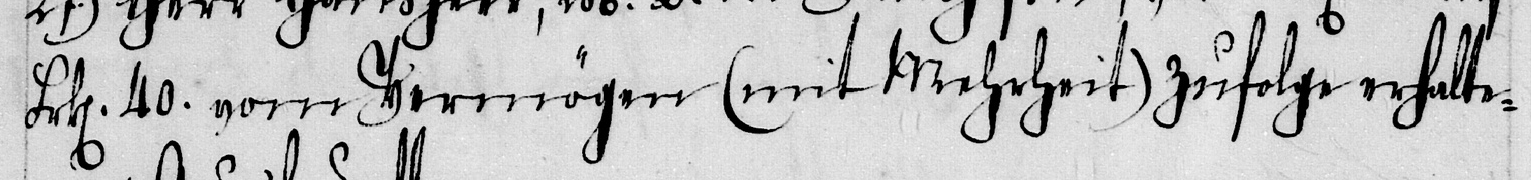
k[en]. 40. vom Vermögen (mit Mehrheit) zufolge erhalte¬
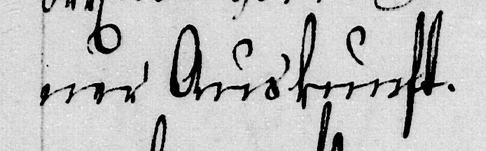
ner Auskunft.
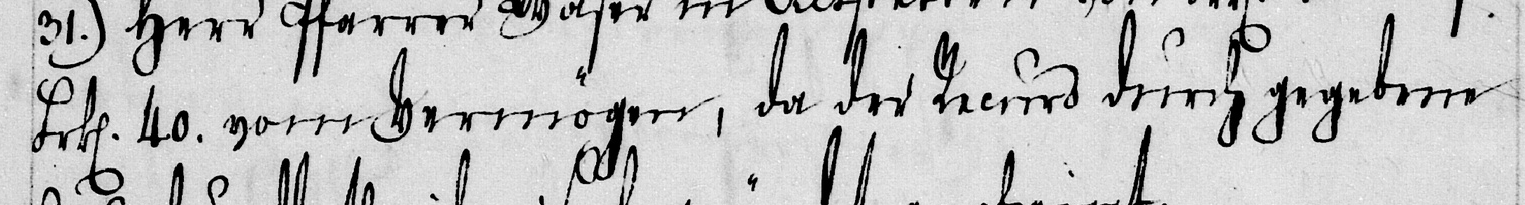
k[en]. 40. vom Vermögen, da der Recurs durch gegebene
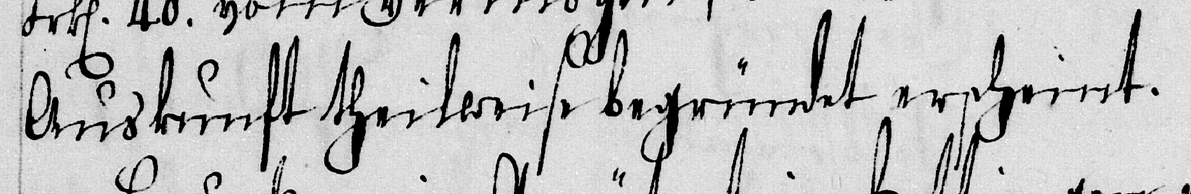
Auskunft theilweise begründet erscheint.
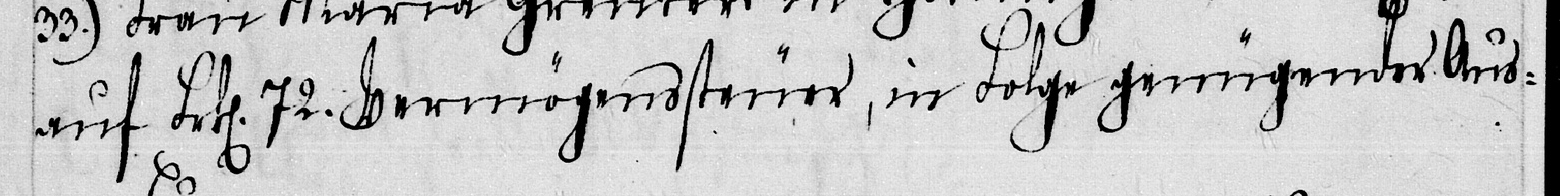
auf Frk[en]. 72. Vermögenssteuer, in Folge genügender Aus¬
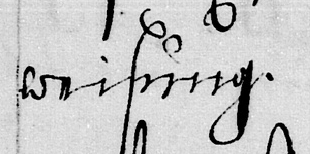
weisung.
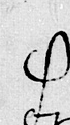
6.
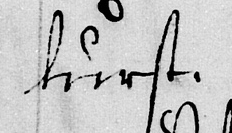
lurst
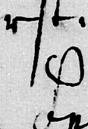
75.
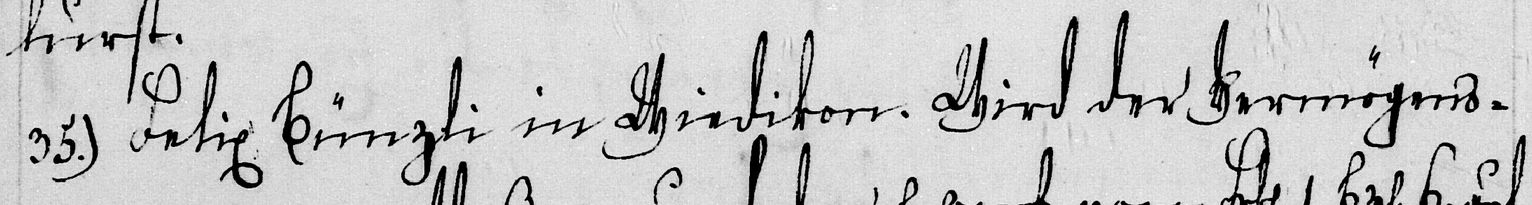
35.) Felix Bünzli in Wiedikon. Wird der Vermögens¬
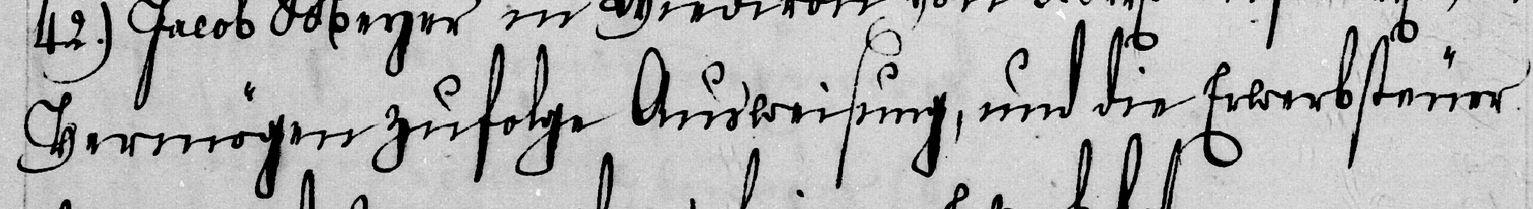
Vermögen zufolge Ausweisung, und die Erwerbssteuer
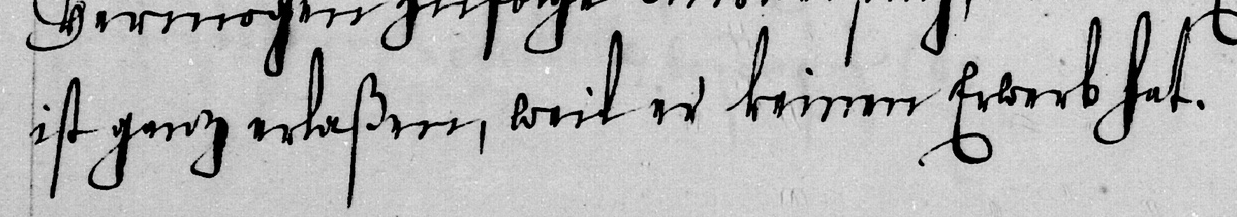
ist ganz erlaßen, weil er keinen Erwerb hat.
